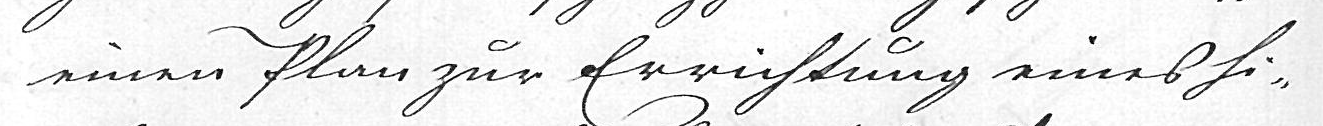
einen Plan zur Errichtung eines hi-
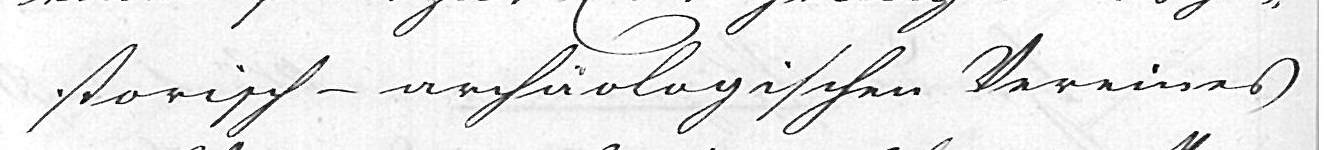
storisch-archäologischen Vereines
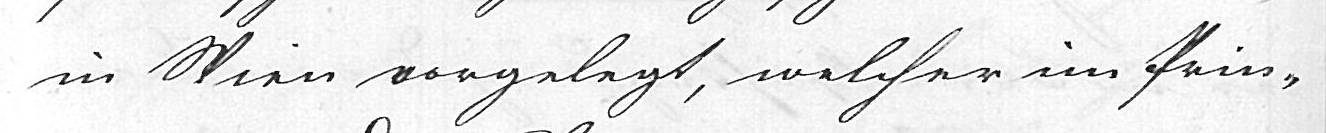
in Wien vorgelegt, welcher im Prin-
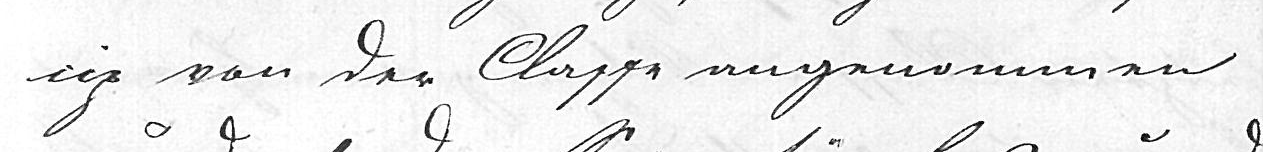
cip von der Classe angenommen
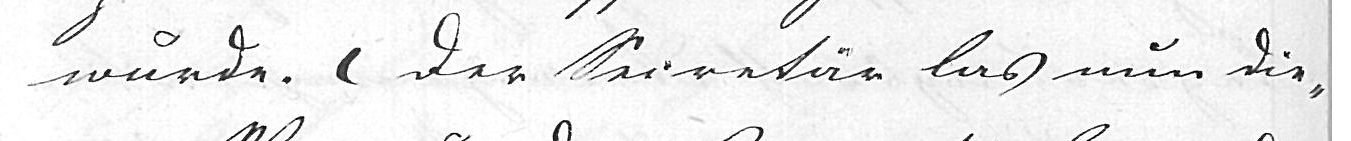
wurde. (der Secretär las nun die-
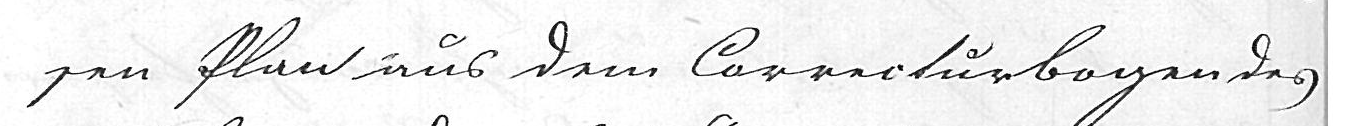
sen Plan aus dem Correcturbogen des
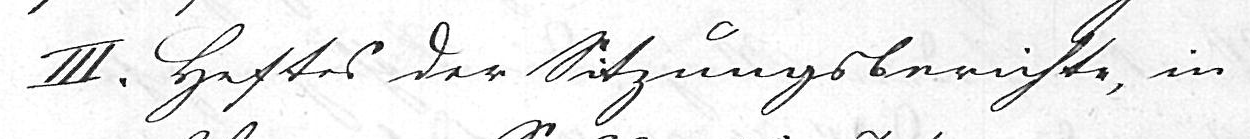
III. Heftes der Sitzungsberichte, in
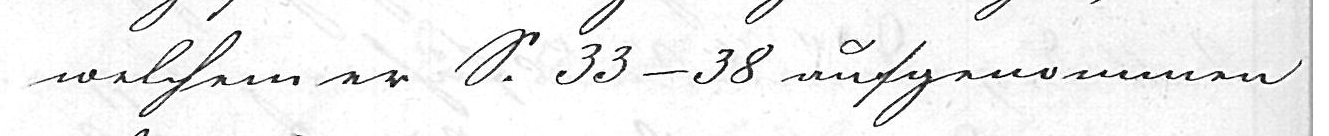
welchem er S. 33-38 aufgenonmen
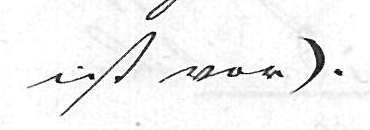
ist vor).
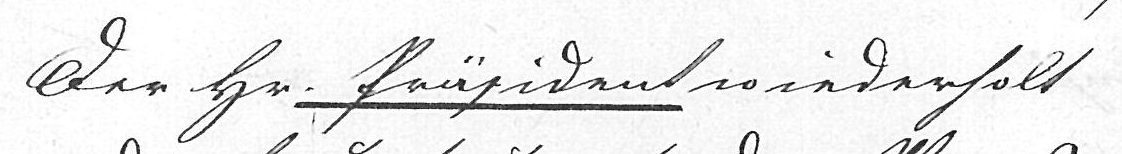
Der Hr. Präsident wiederholt
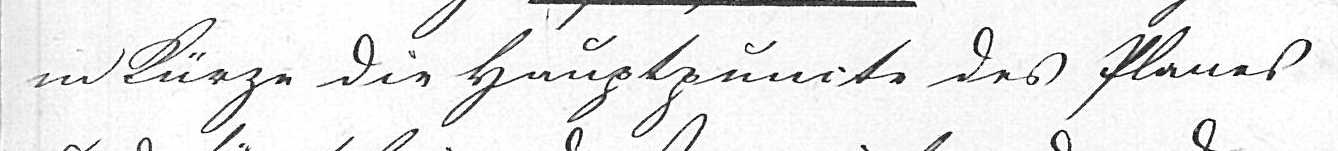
in Kürze die Hauptpuncte des Planes
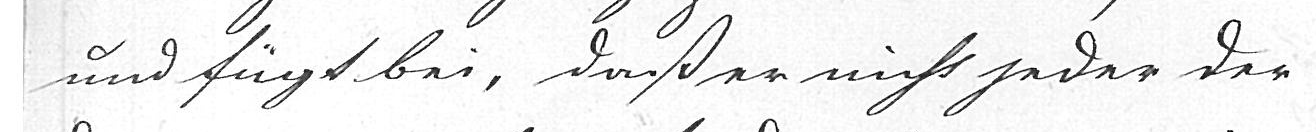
und fügt bei, daß er nicht jeder der
